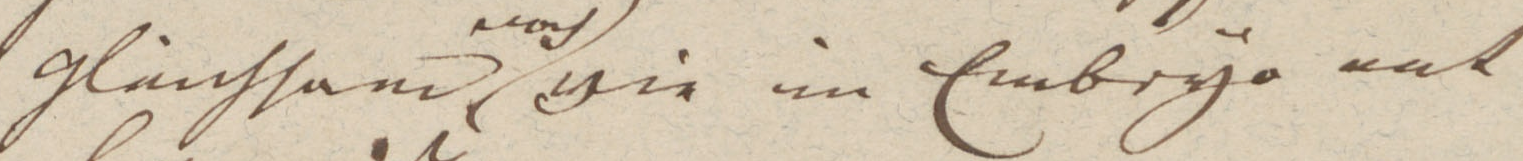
gleichsam noch wie im Embryo ent-
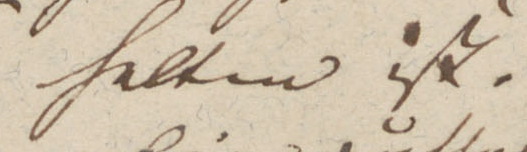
halten ist.
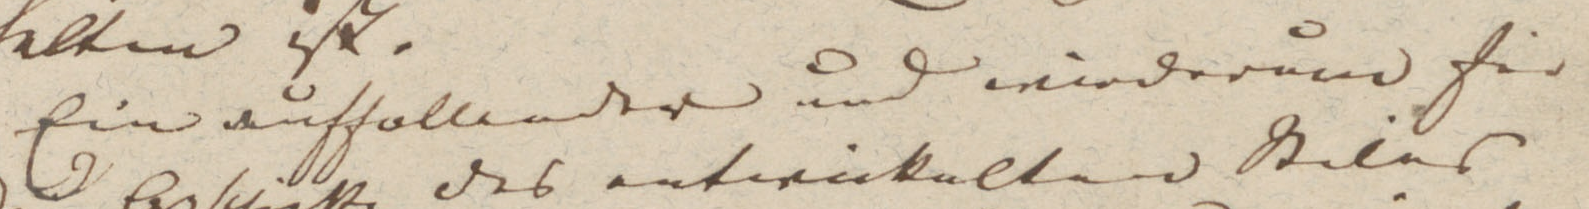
Ein auffallender und wiederum für
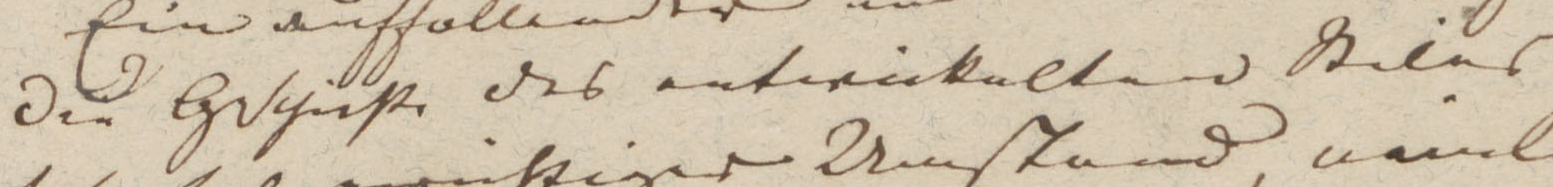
die Geschichte des entwickelten Stiles
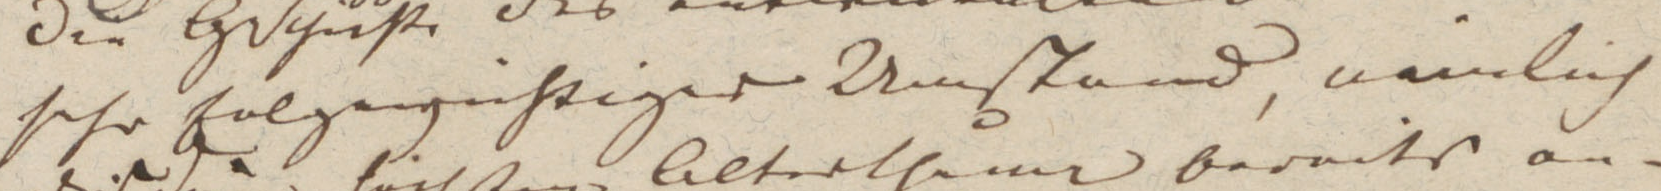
sehr folgewichtiger Umstand, nämlich
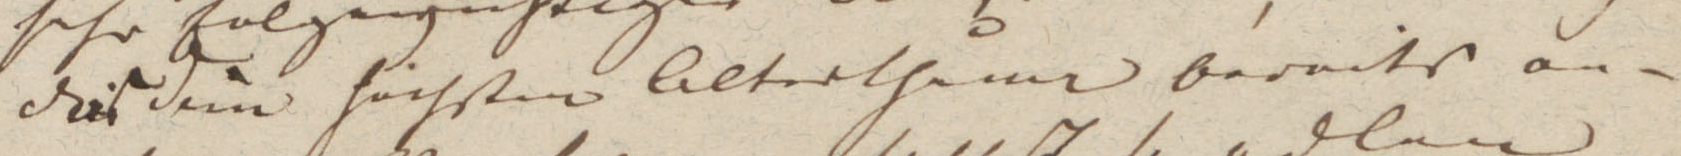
das dm höchsten Alterthume bereits an-
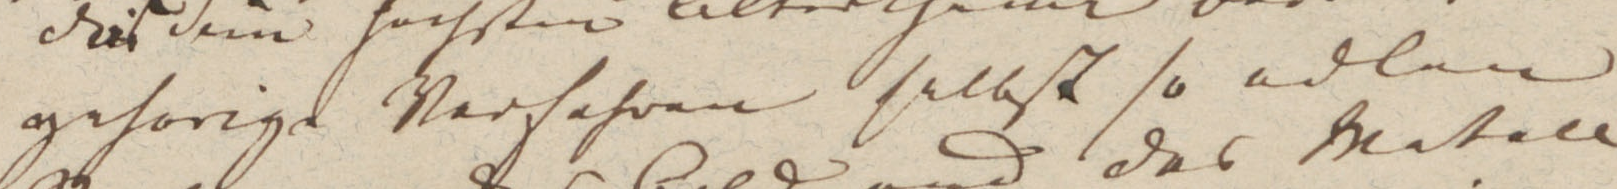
gehorige Verfahren selbst so edlen
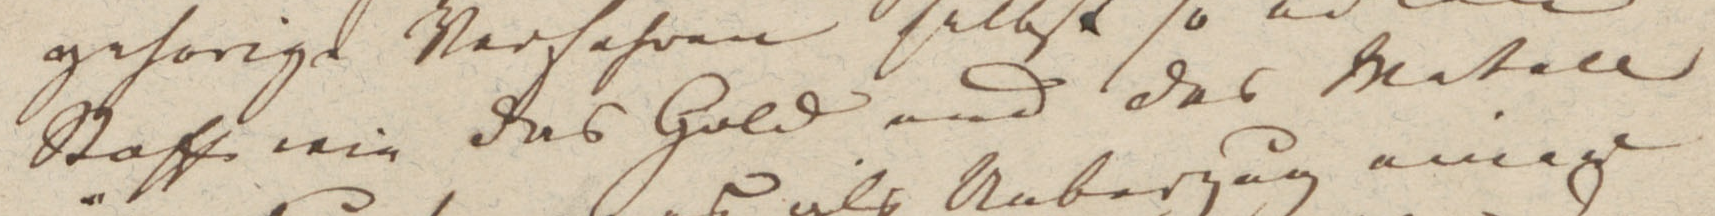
Stoff wie das Gold und das Metall
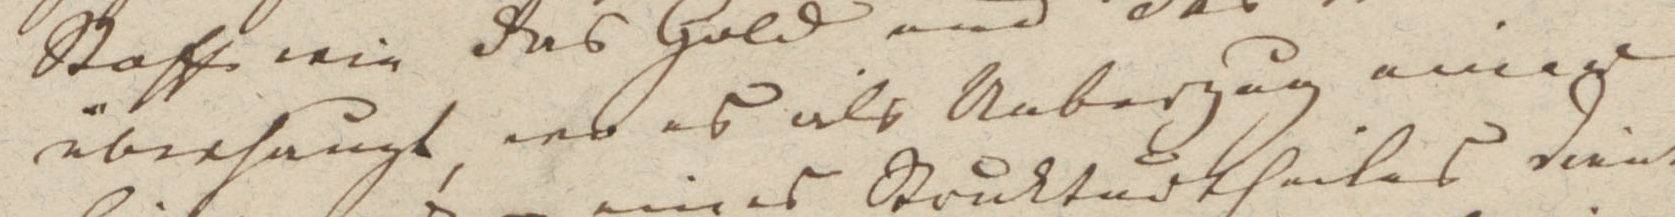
überhaupt, wo es als Ueberzug einer
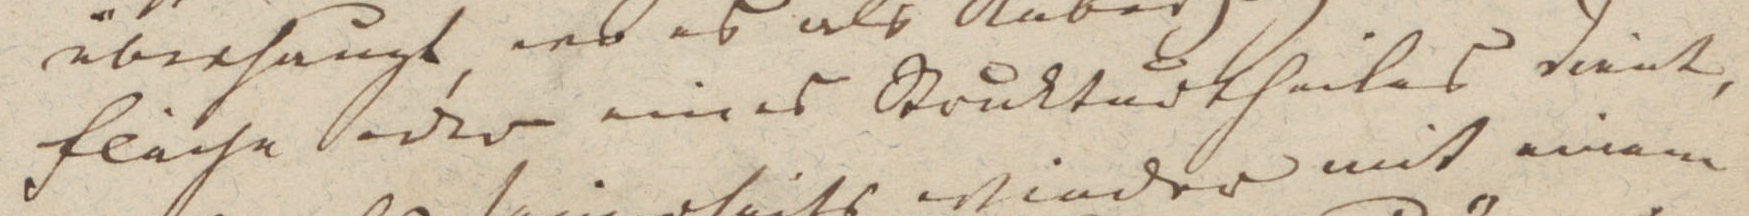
Fläche oder eines Strukturtheiles dient,
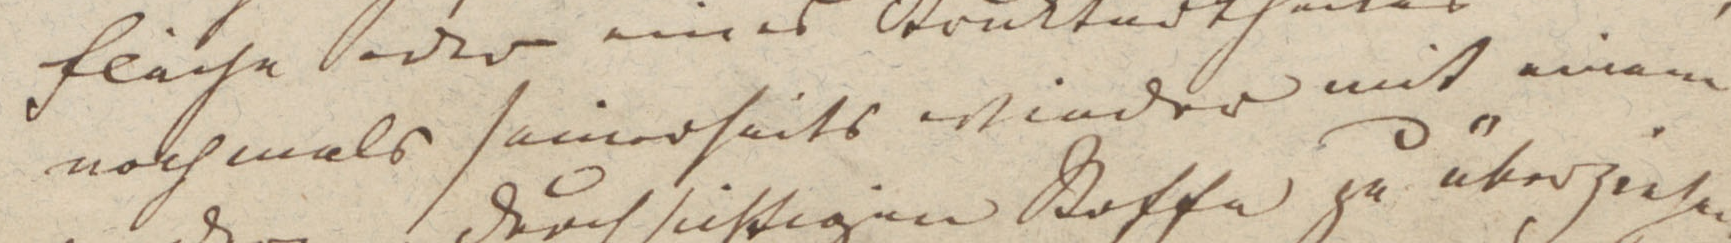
nochmals seinerseits wieder mit einem
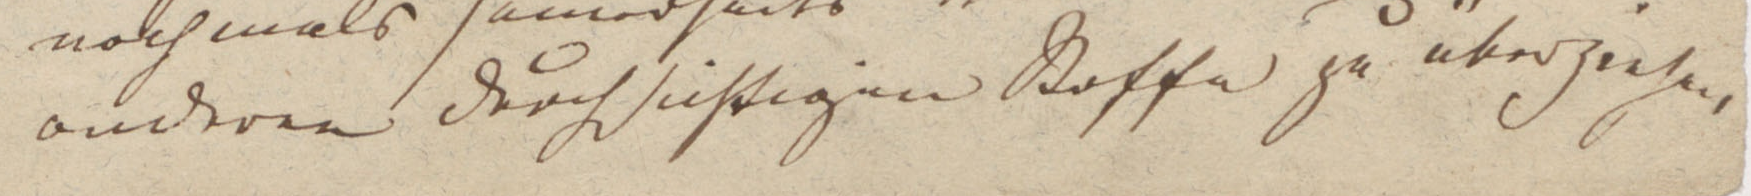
anderen durchsichtigen Stoffe zu überziehen
